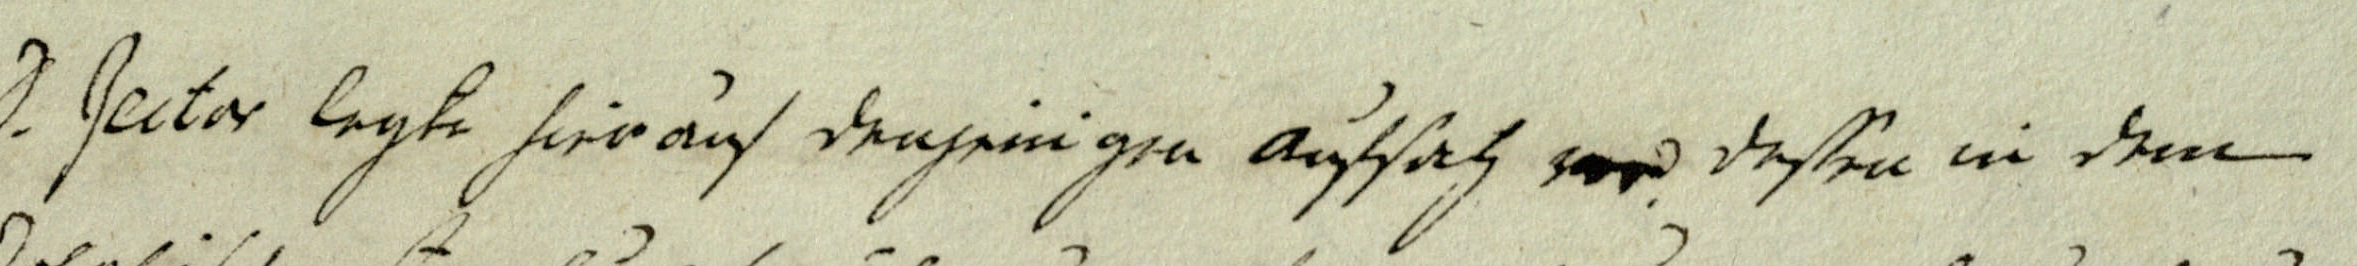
M. D. Rector legte hierauf denjenigen Aufsatz vor dessen in dem
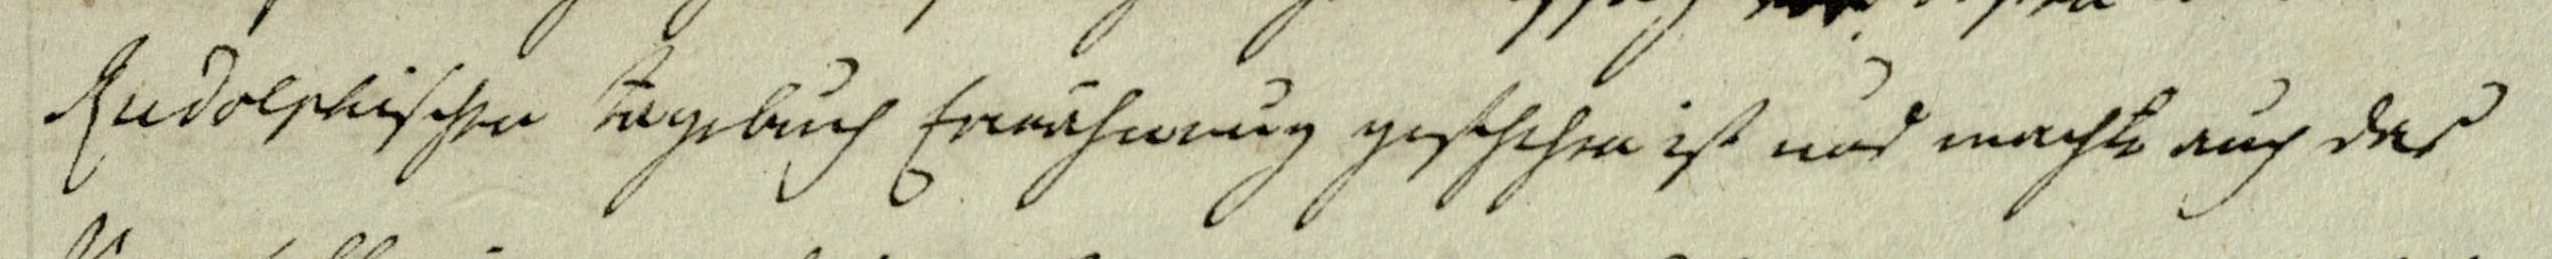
Rudolphischen Tagebuch Erwähnung geschehen ist und machte auch das
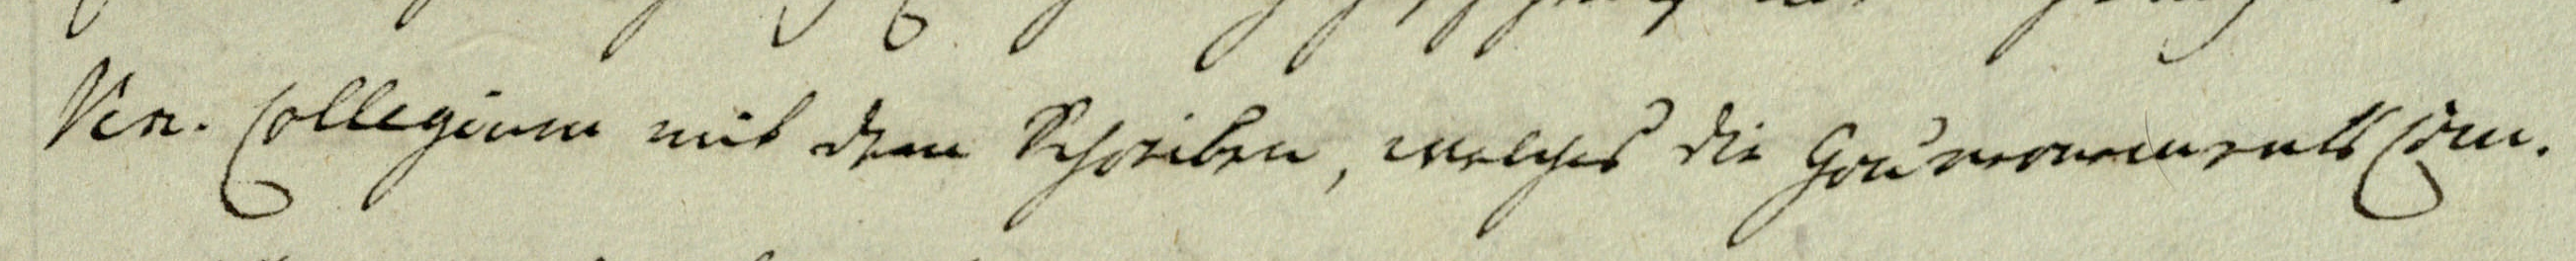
Ven. Collegium mit dem Schreiben, welches die Gouvernements Com¬
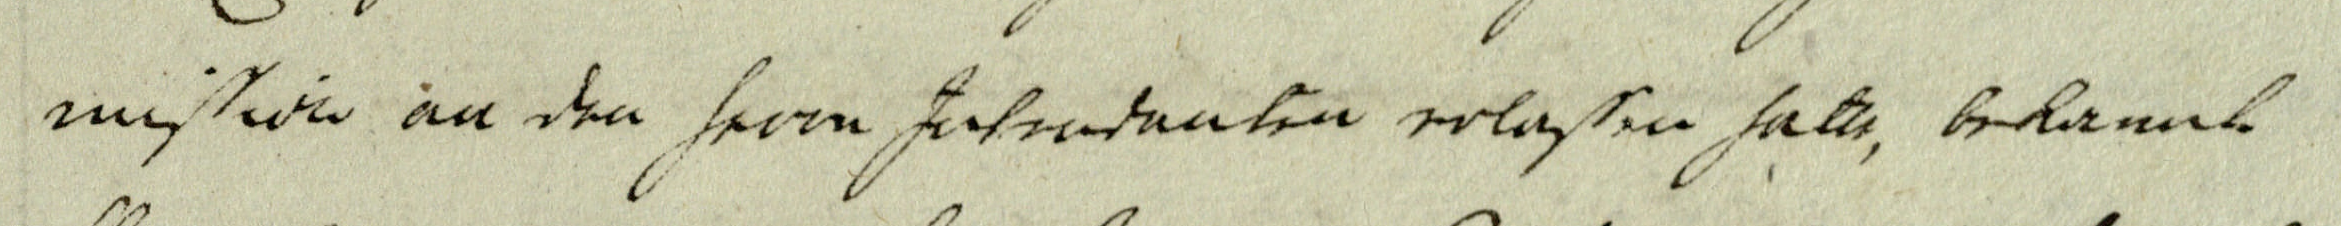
mission an den Herrn Intendanten erlassen hatte, bekannt.
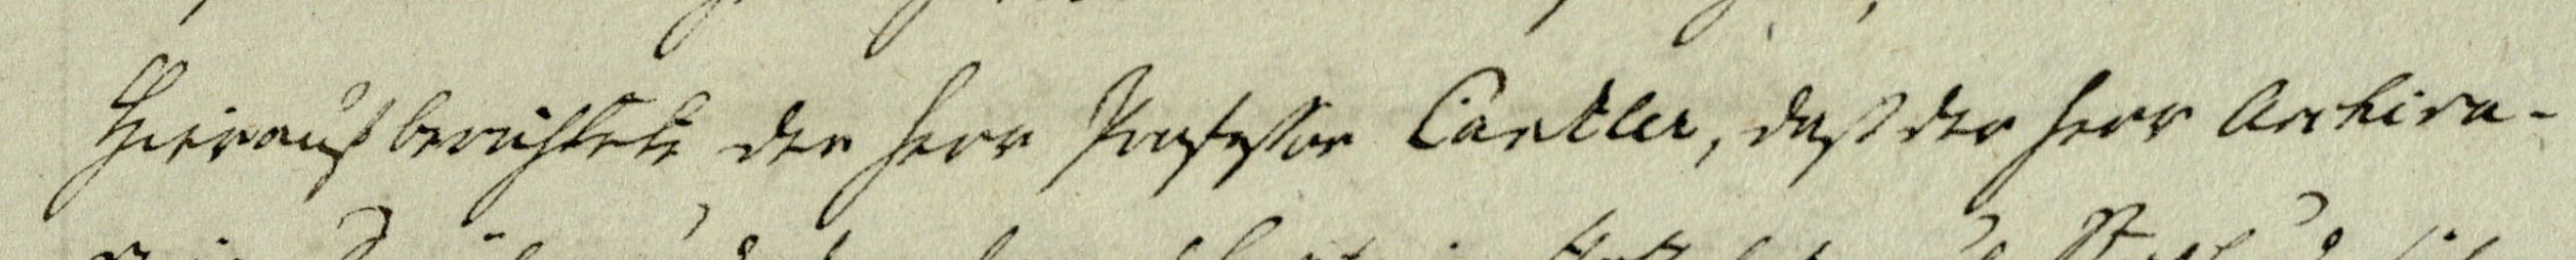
Hierauf berichtete der Herr Professor Canzler, daß der Herr Archiva¬
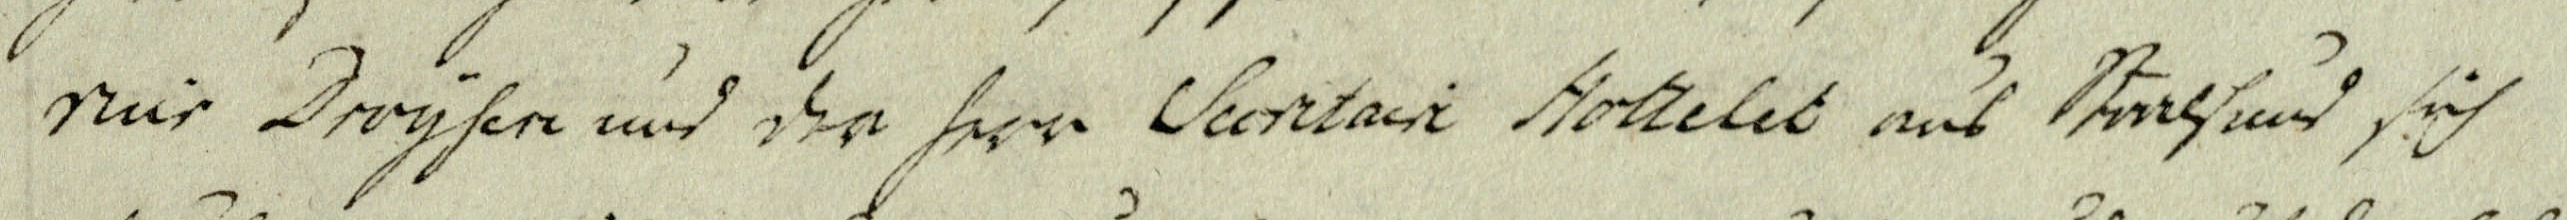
rius Droÿsen und der Herr Secretaire Hottelet aus Stralsund sich
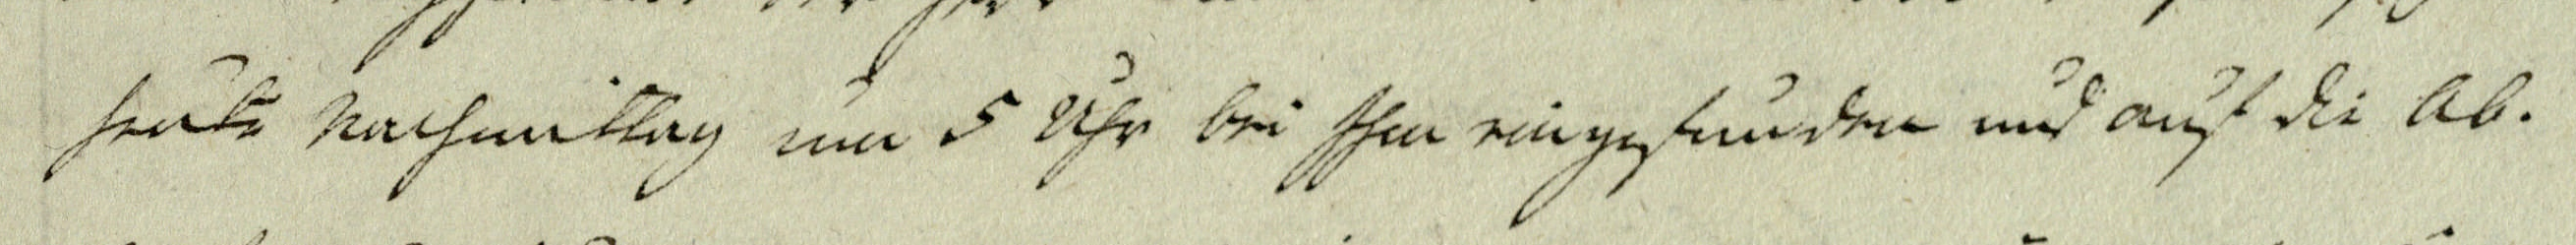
heute Nachmittag um 5 Uhr bei Ihm eingefunden und auf die Ab¬
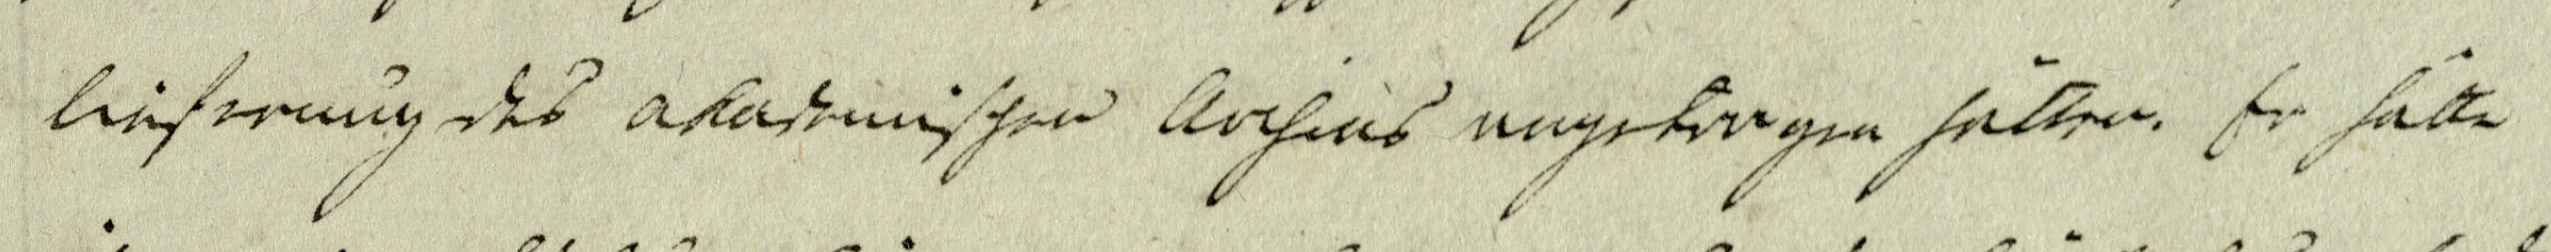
lieferung des akademischen Archivs angetragen hätten. Er hätte
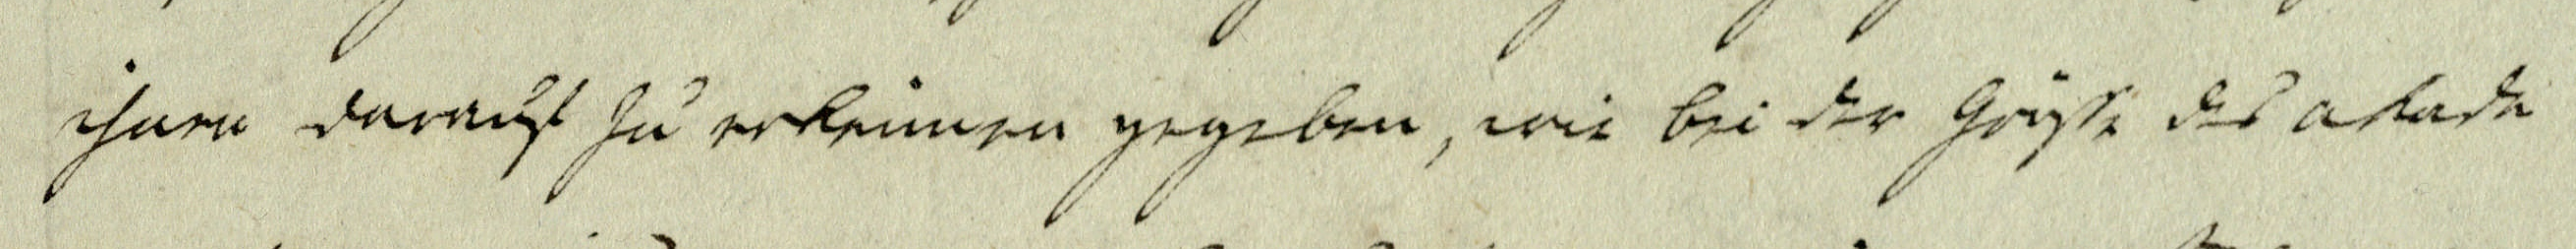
ihnen darauf zu erkennen gegeben, wie bei der Grösse des akade¬
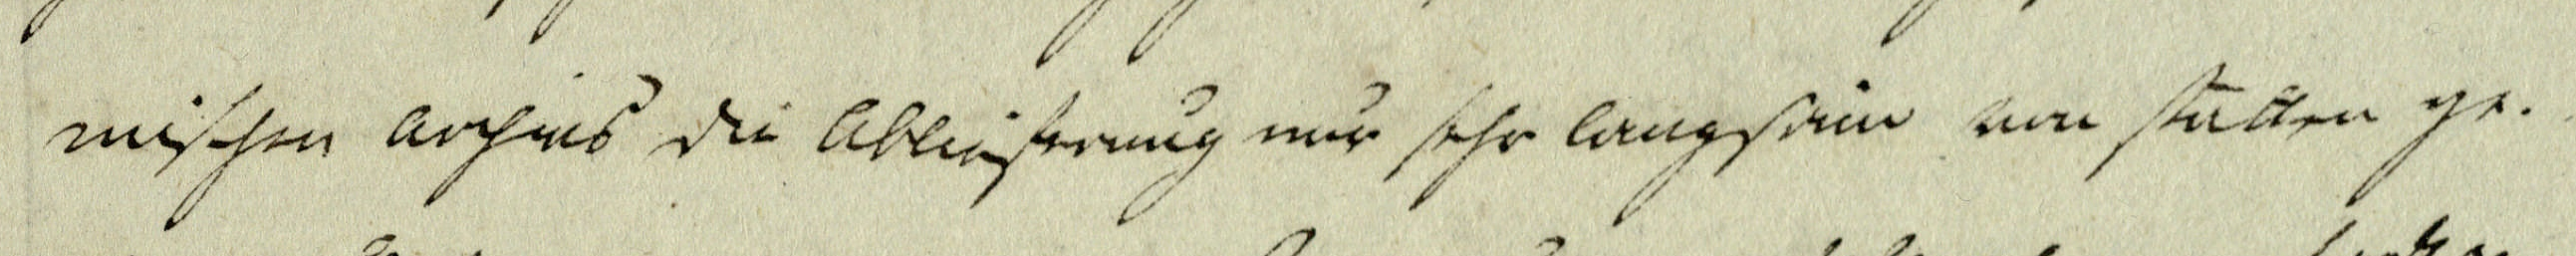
mischen Archivs die Ablieferung nur sehr langsam von statten ge¬
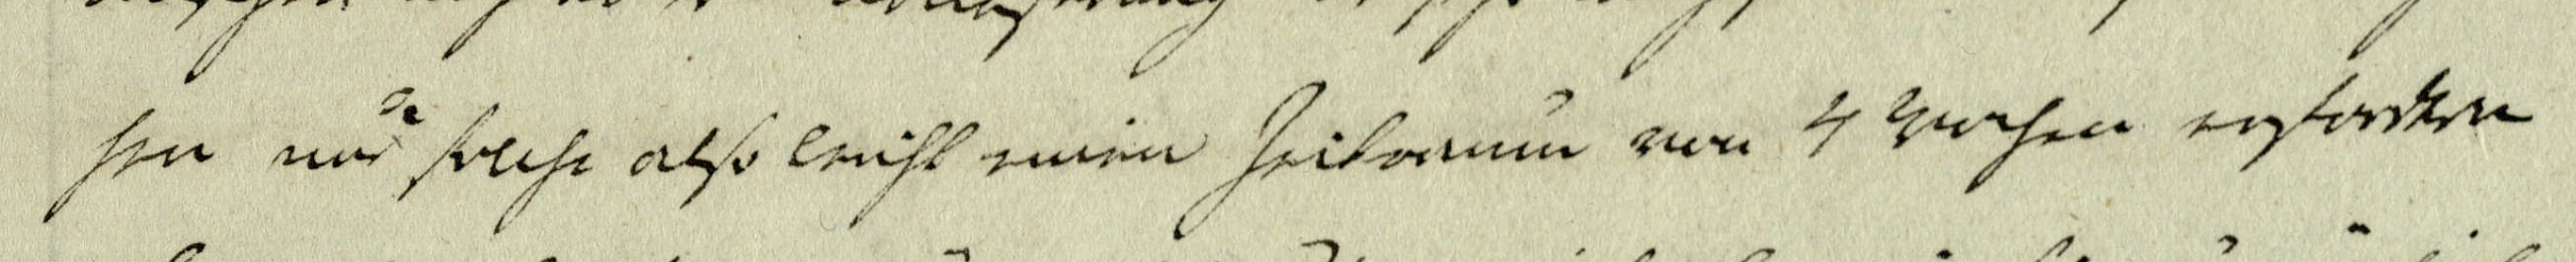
hen und solche also leicht einen Zeitraum von 4 Wochen erfordern
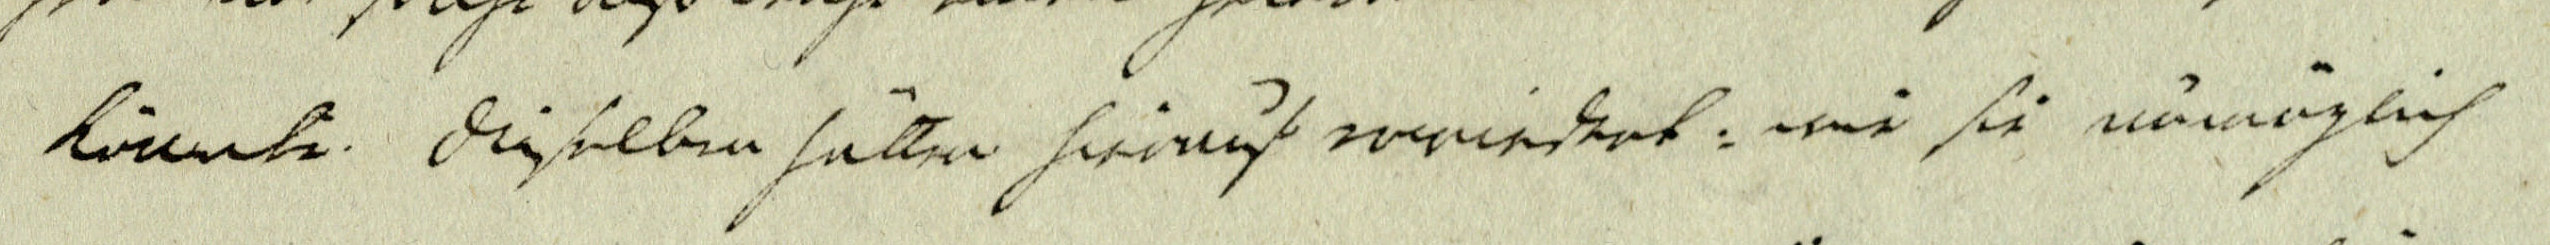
könnte. Dieselben hätten hierauf erwiedert: wie sie unmöglich
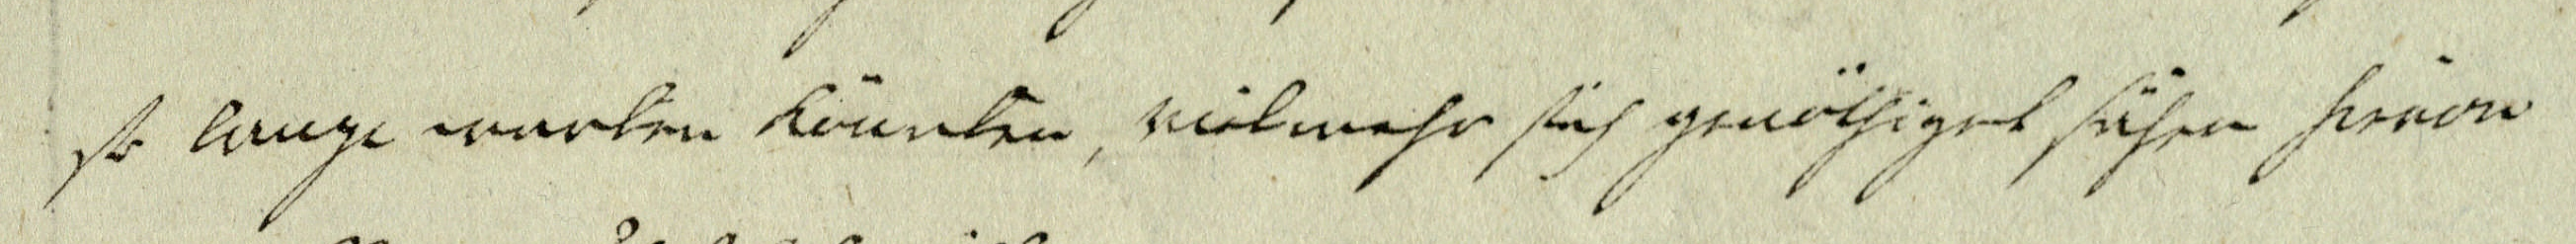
so lange warten könnten, vielmehr sich genöthiget sähen hievon
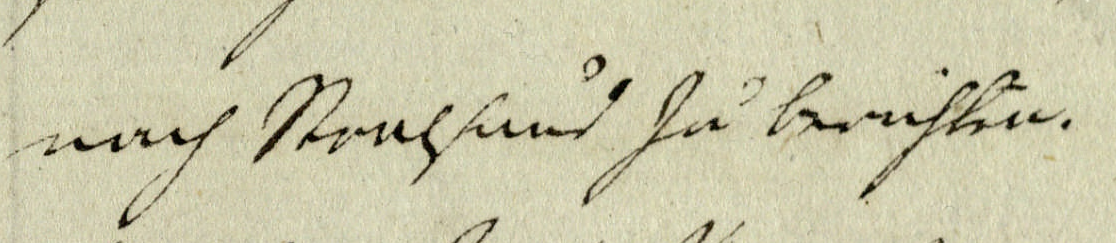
nach Stralsund zu berichten.
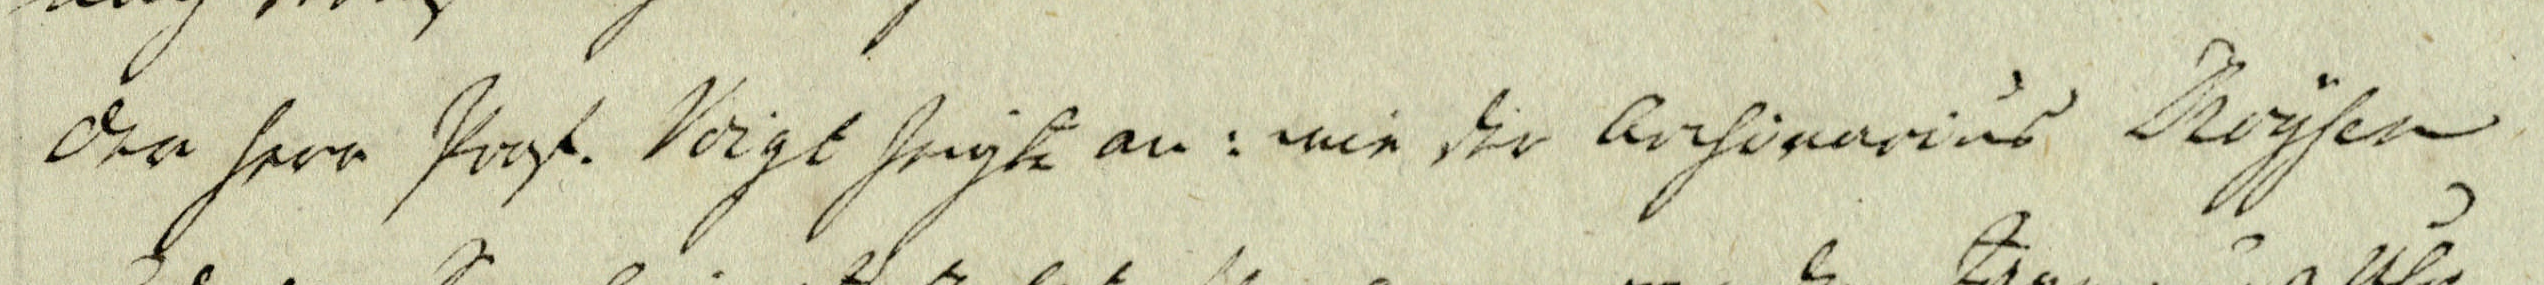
der Herr Prof. Voigt zeigte an: wie der Archivarius Droÿsen
